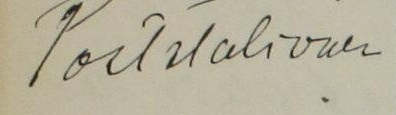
Poststationen
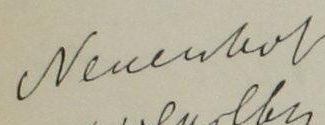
Neuenhof
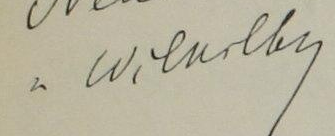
u Wilkilby
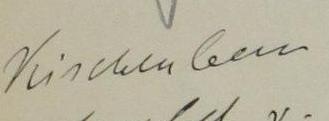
Kirchenbau
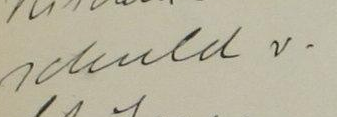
schuld v.
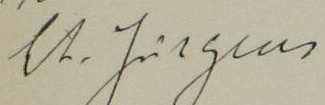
St. Jürgens
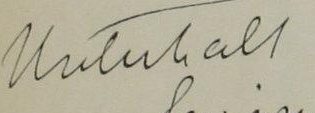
Unterhalt
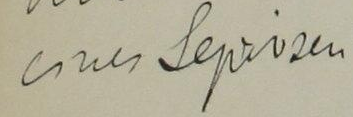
eines Leprösen
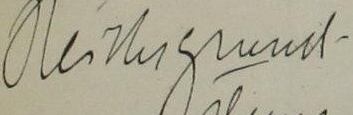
Reichsgrund
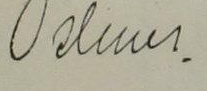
steuer
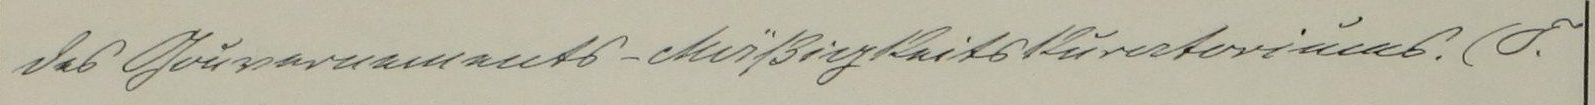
des Gouvernements-Mäßigkeitskuratoriums (T.
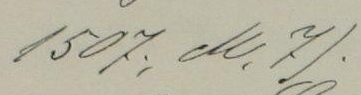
1507; M.7).
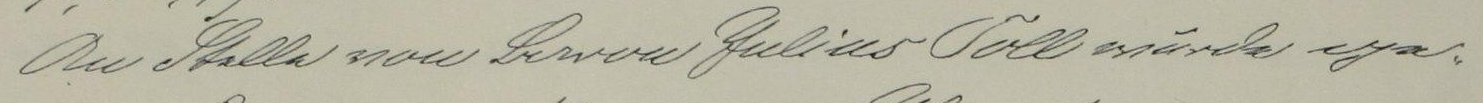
An Stelle von Baron Julius Toll wurde ge-
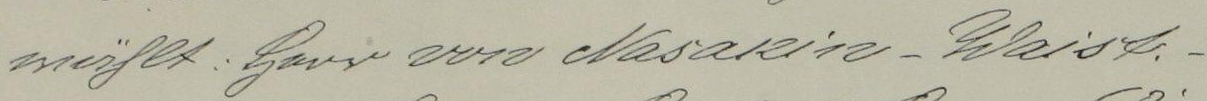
wählt: Herr von Nasakin-Waist.
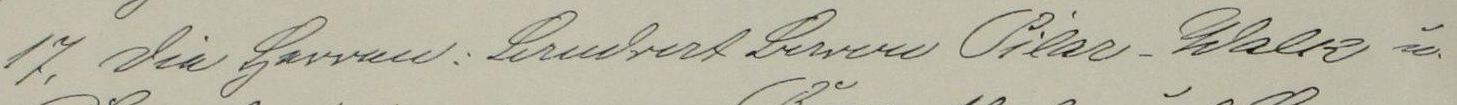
17. Die Herren: Landrat Baron Pilar-Walk u.
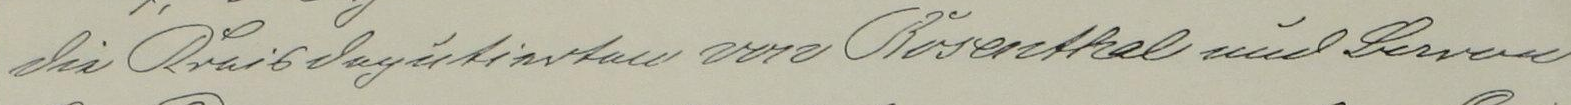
die Kreisdeputierten von Rosenthal und Baron
